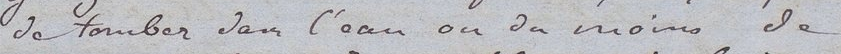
de tomber dans l'eau ou du moins de
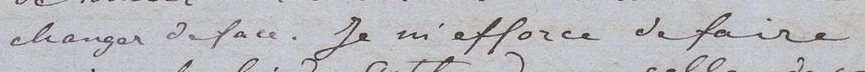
changer de face. Je m'efforce de faire
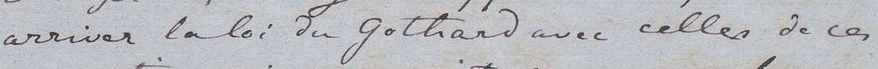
arriver la loi du Gothard avec celles de ces
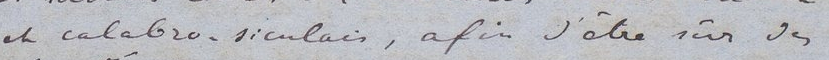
et calabro-siculais, afin d'être sûr des
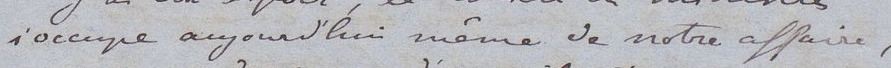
s'occupe aujourd'hui même de notre affaire,
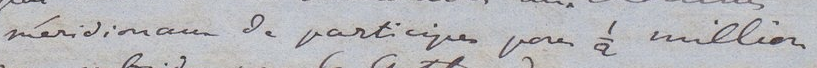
méridionaux de participer pour ½ million
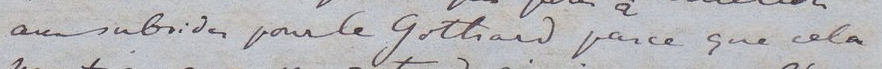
aux subsides pour le Gothard parce que cela
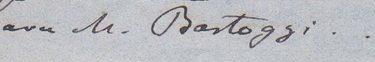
avec M. Bastoggi. . –
